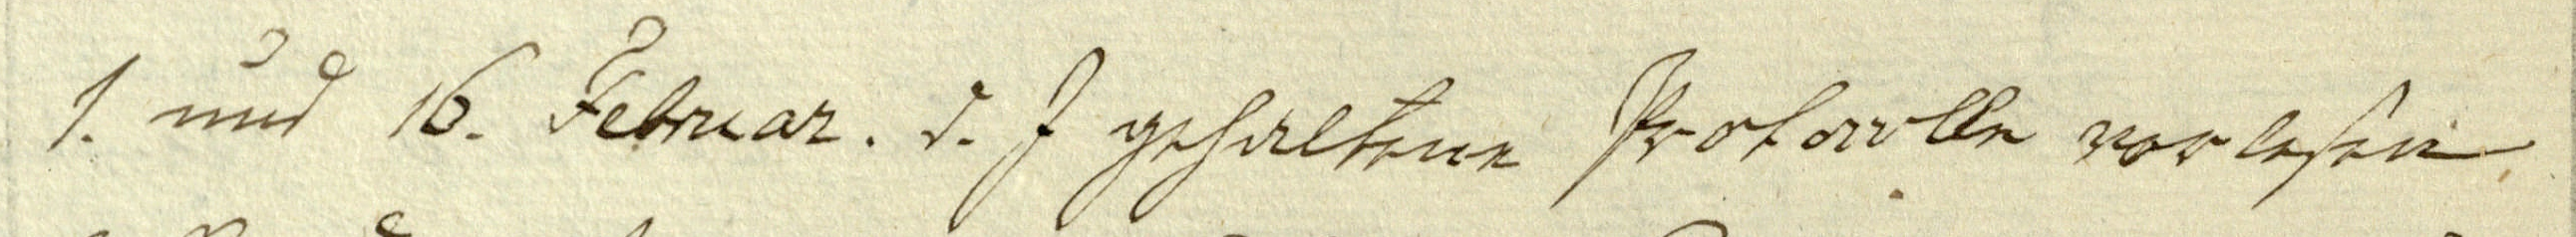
1. und 16. Februar d. J. gehaltene Protocolle verlesen
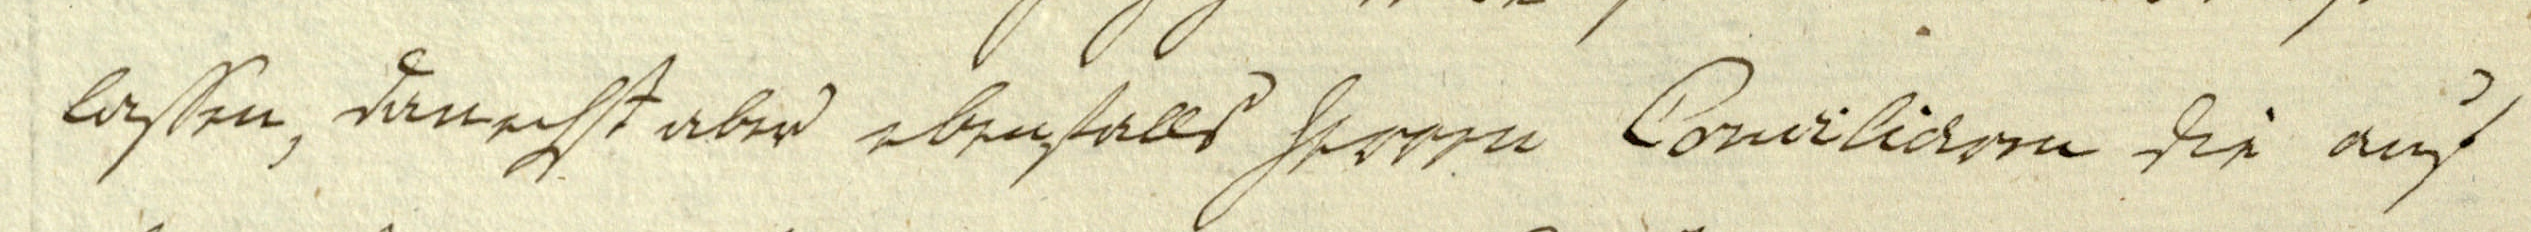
lassen, danechst aber ebenfalls herren Conciliaren die auf
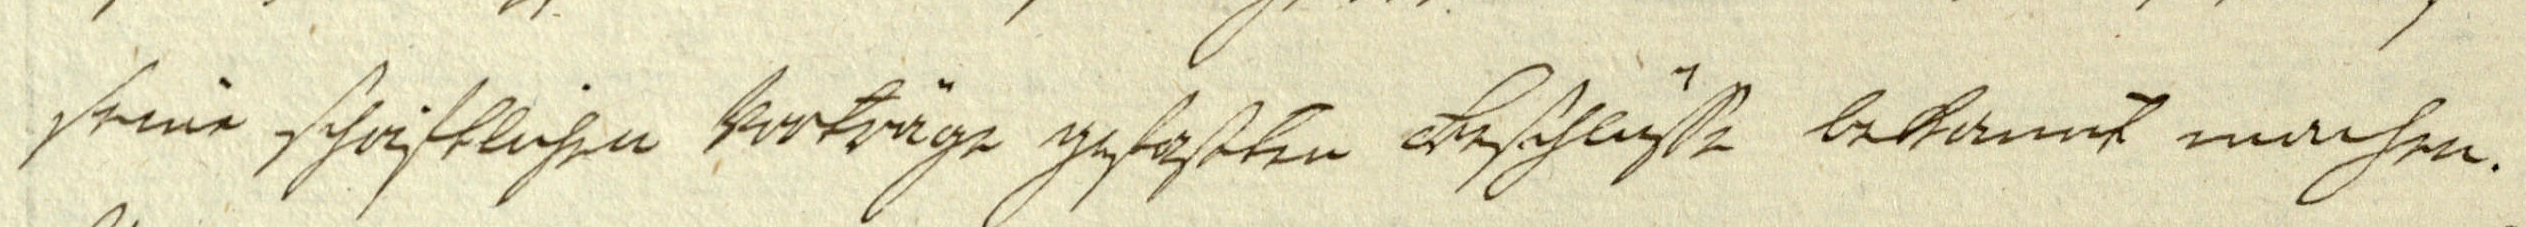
seine schriftlichen Vorträge gefaßten Beschlüsse bekannt machen.
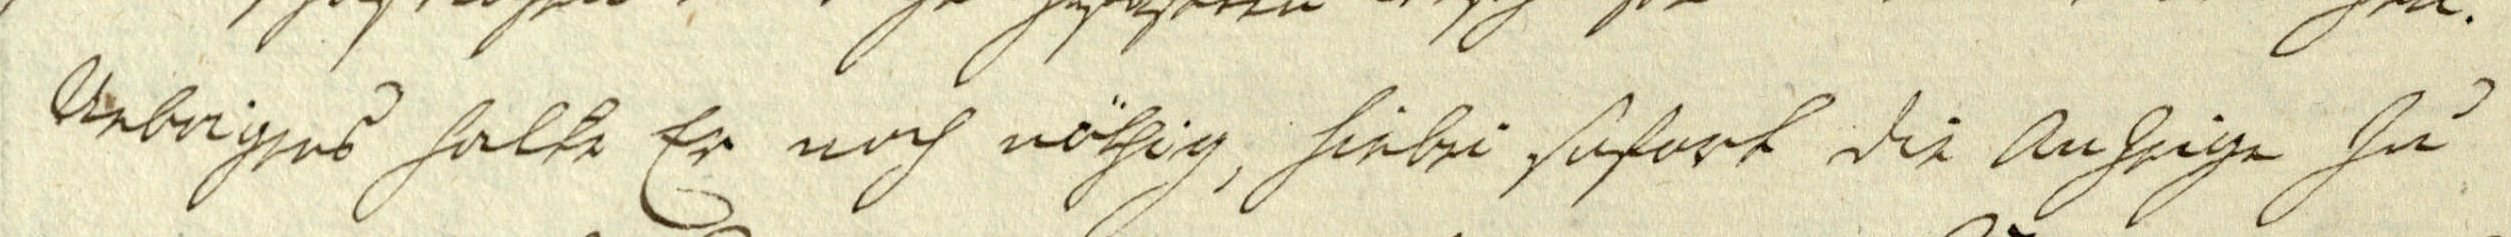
Uebrigens halte Er noch nöthig, hiebei sofort die Anzeige zu
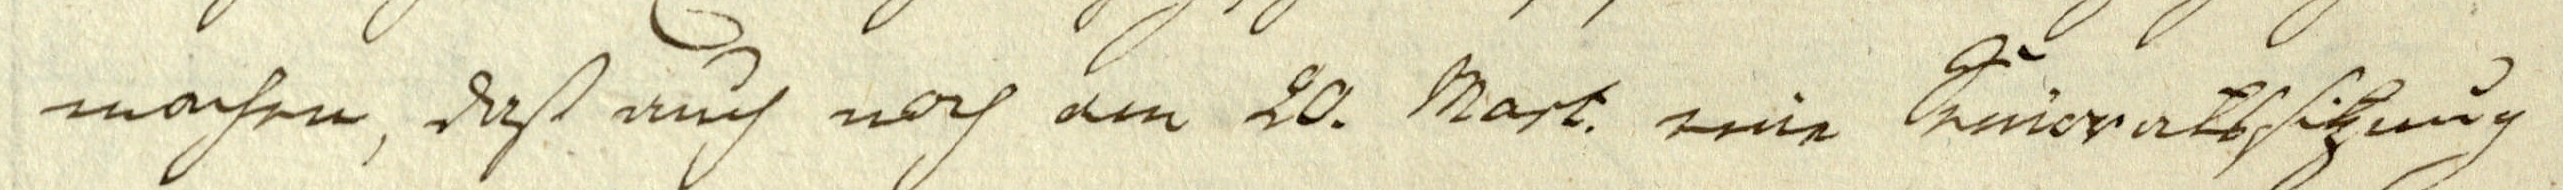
machen, daß auch noch am 20. Mart. eine Senioratssitzung
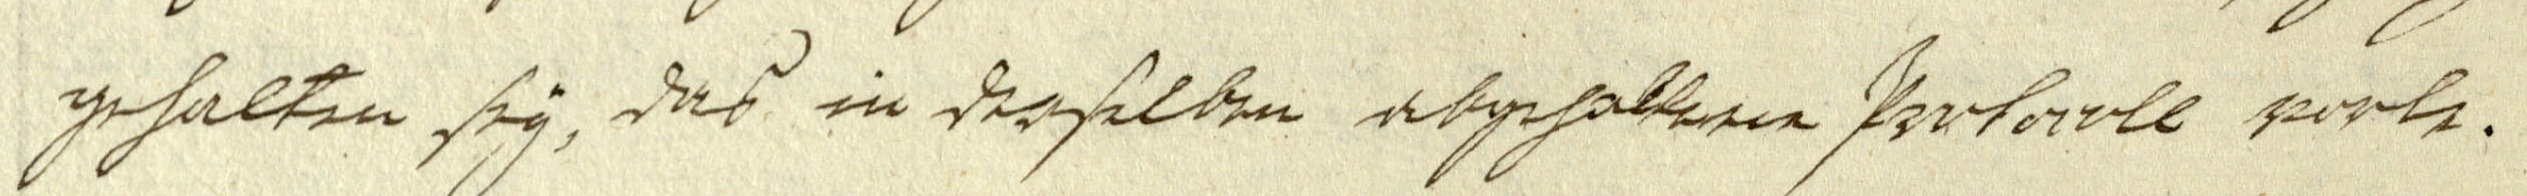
gehalten seÿ, das in derselben abgehaltene Protocoll vorle¬
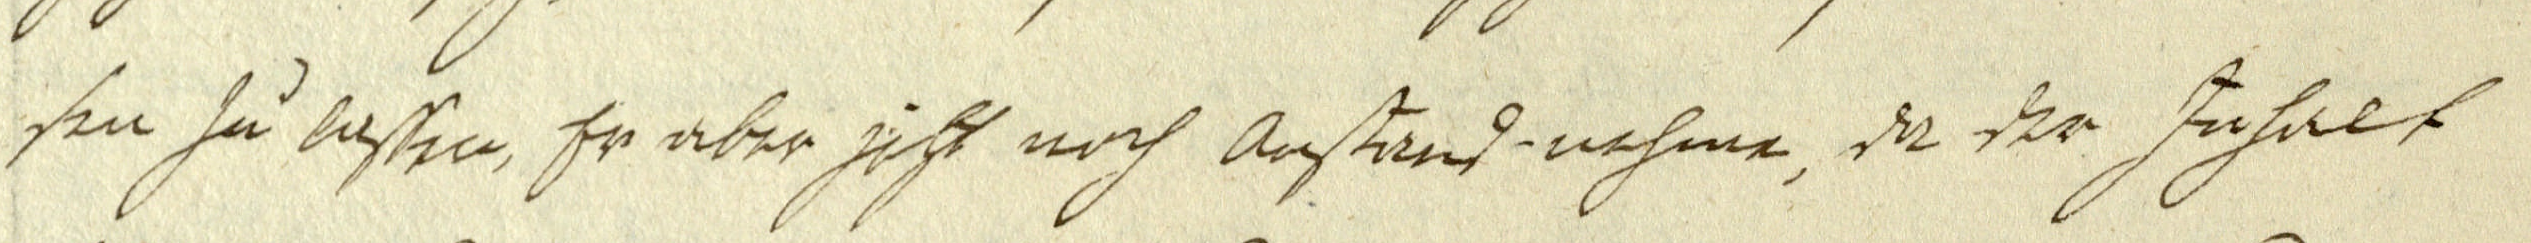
sen zu lassen, Er aber jetzt noch Anstand nehme, da der Inhalt
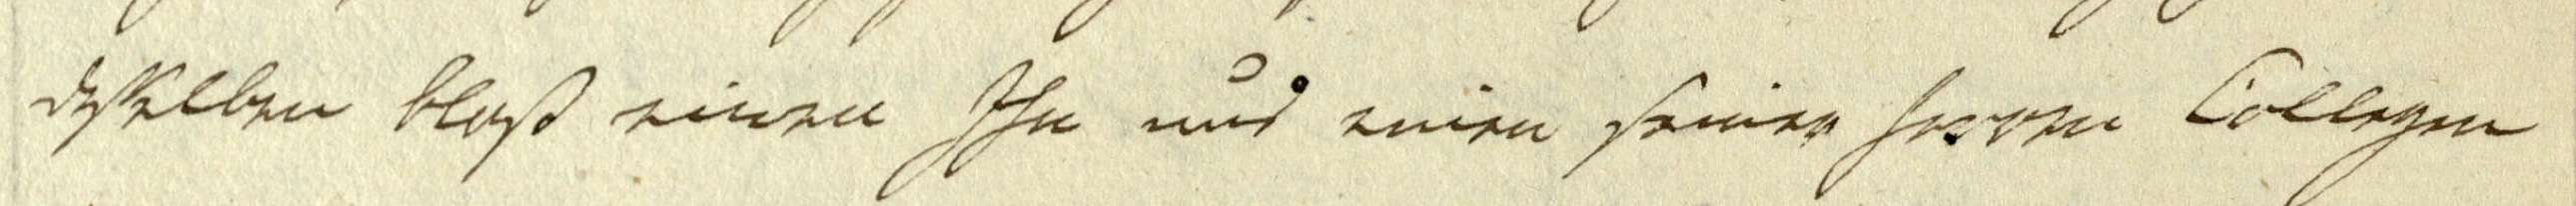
desselben bloß einen Ihn und einen seiner herren Collegen
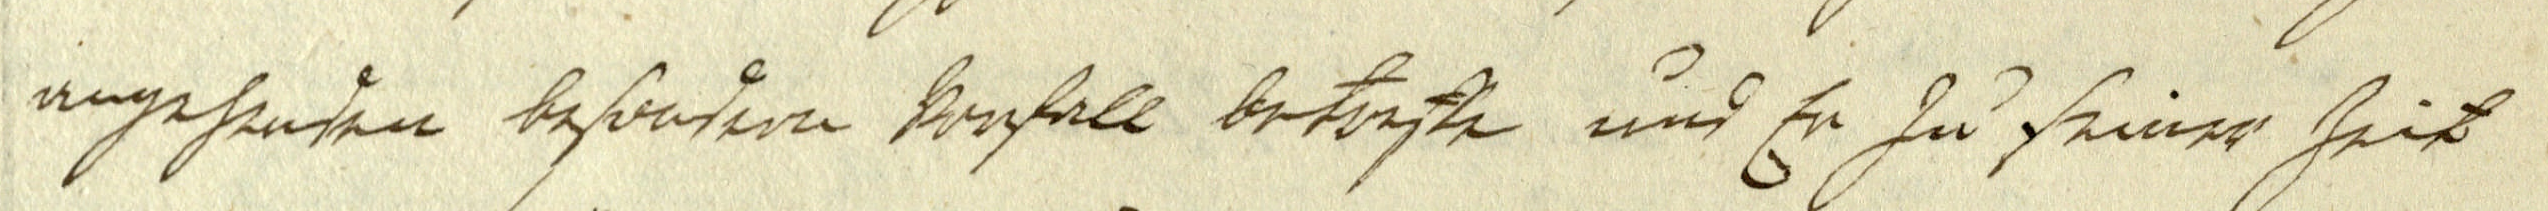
angehenden besonderen Vorfall betreffe und Er zu seiner Zeit
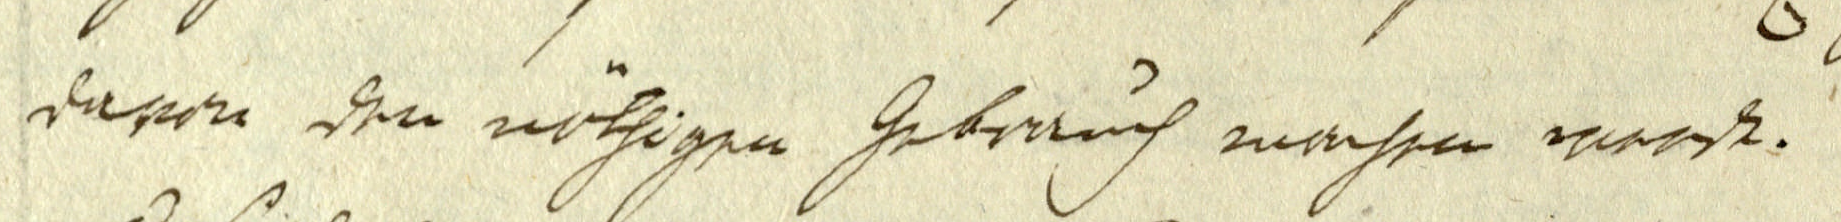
davon den nöthigen Gebrauch machen werde.
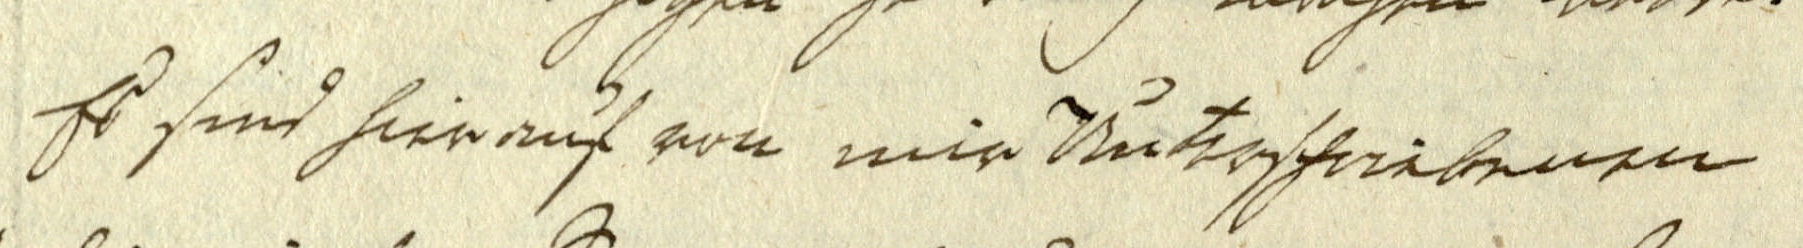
Es sind hierauf von mir Unterschriebenen
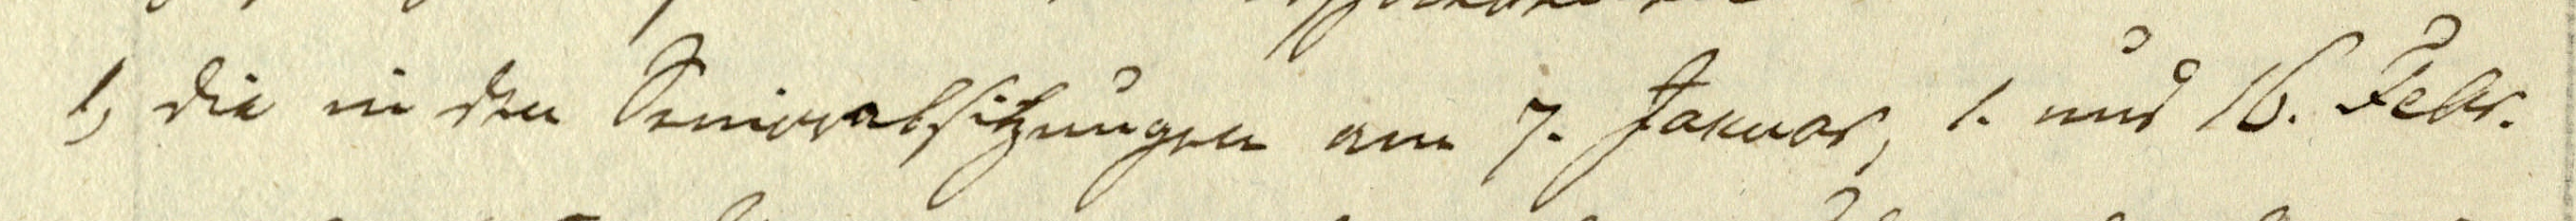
1, die in den Senioratsitzungen am 7. Januar, 1. und 16. Febr.
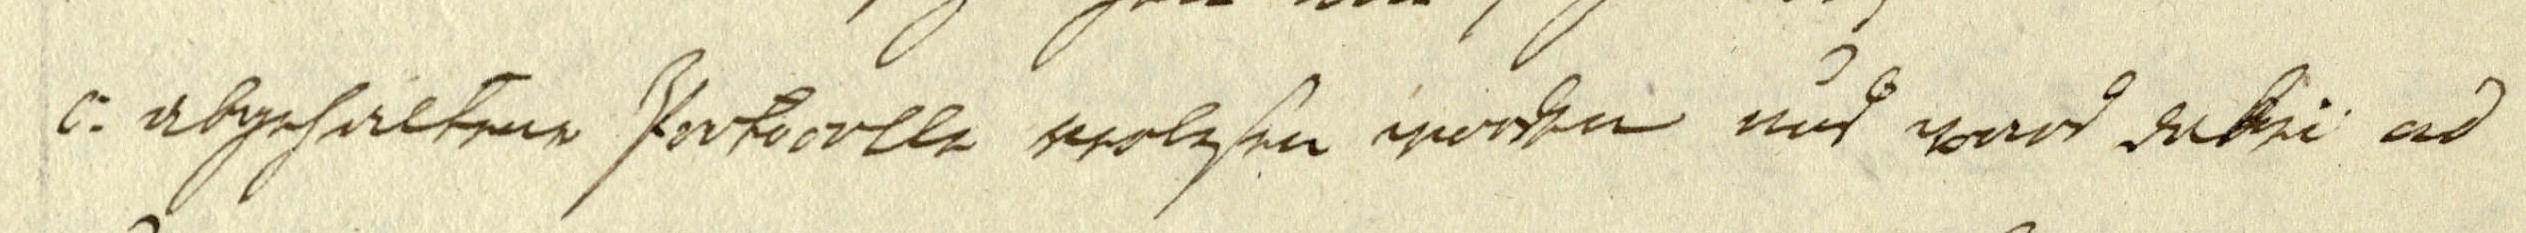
c. abgehaltenen Protocolle verlesen worden und ward dabei ad
